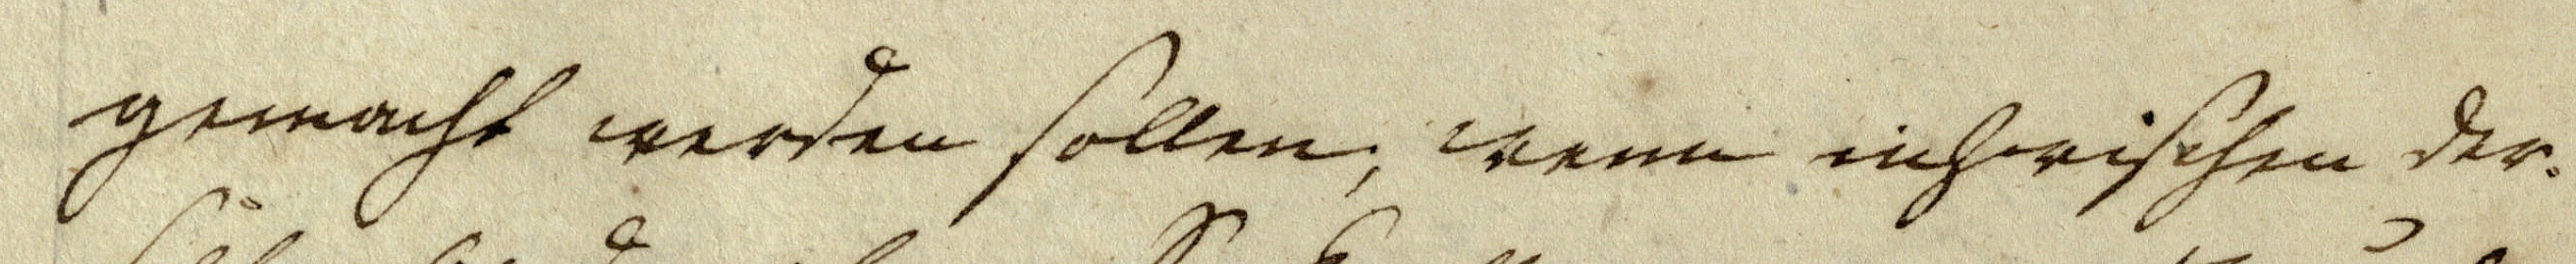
gemacht werden sollen, wenn inzwischen der¬
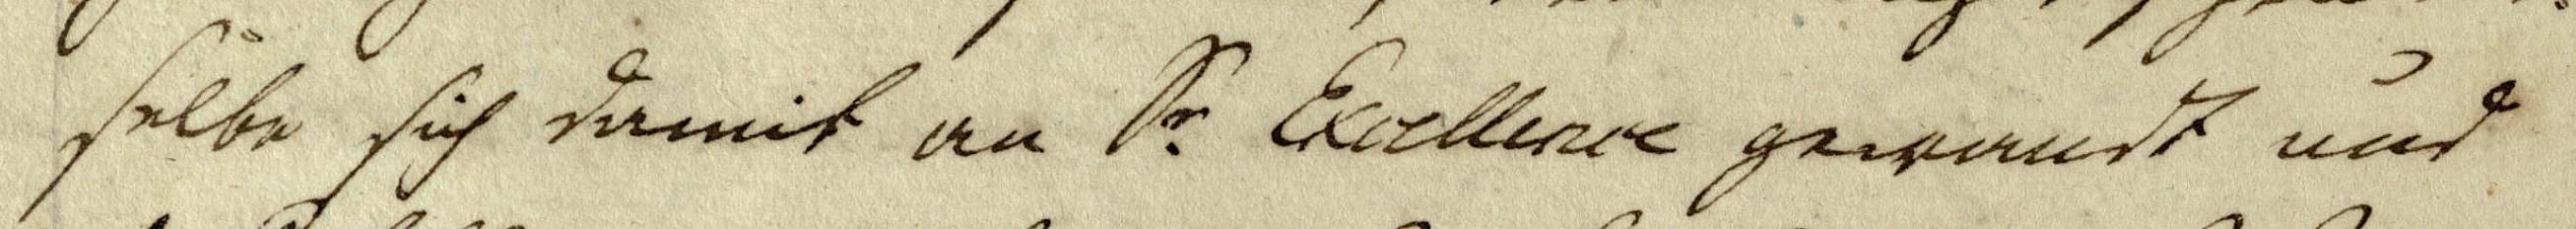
selbe sich damit an Sr Excellence gewandt und
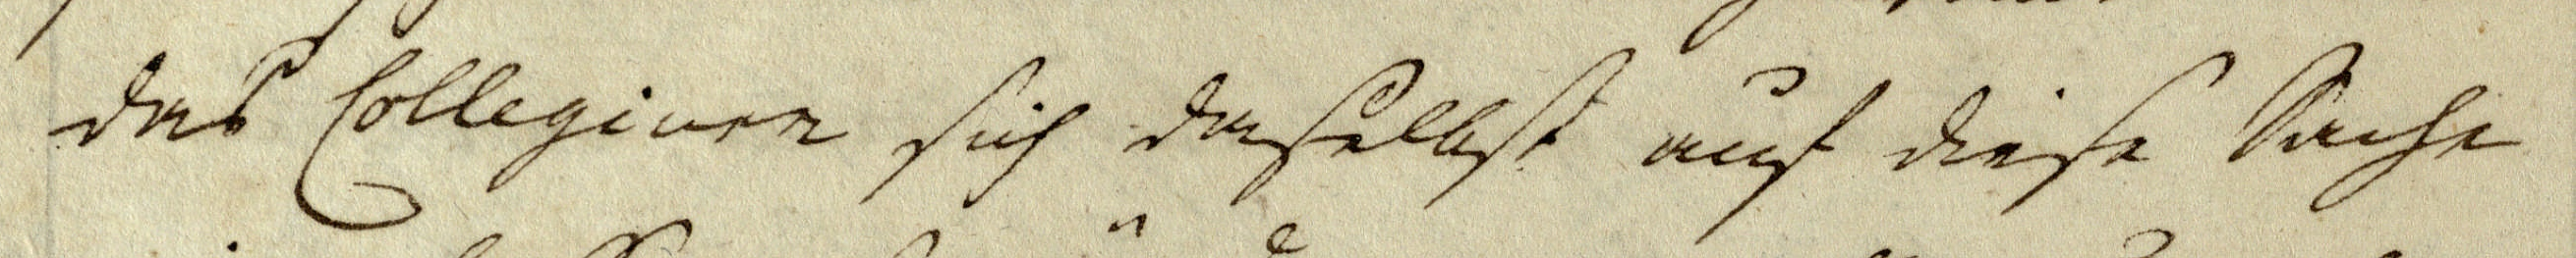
das Collegium sich daselbst auf diese Sache
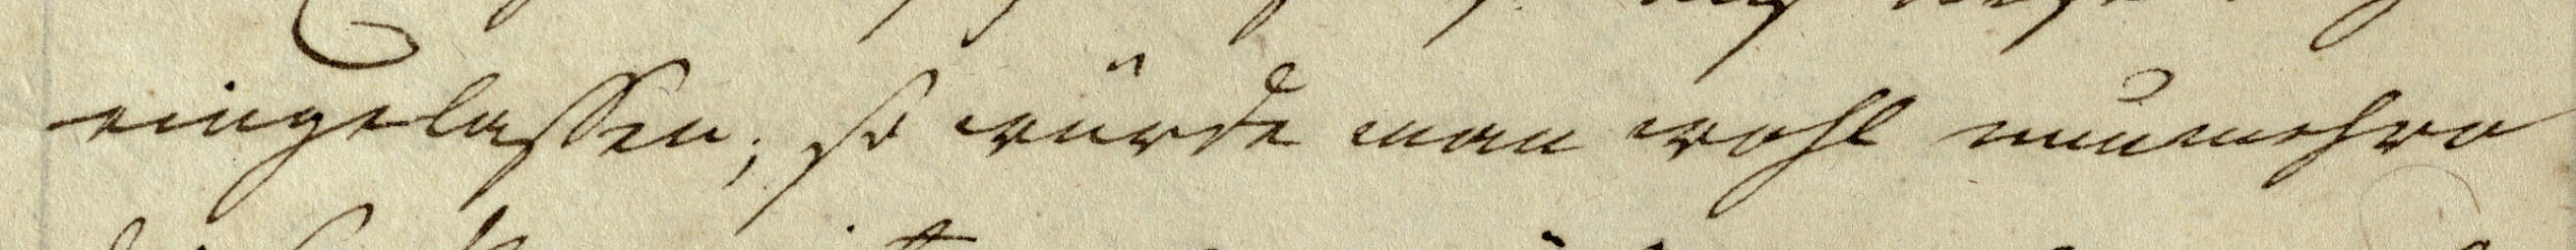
eingelassen; so würde man wohl nunmehro
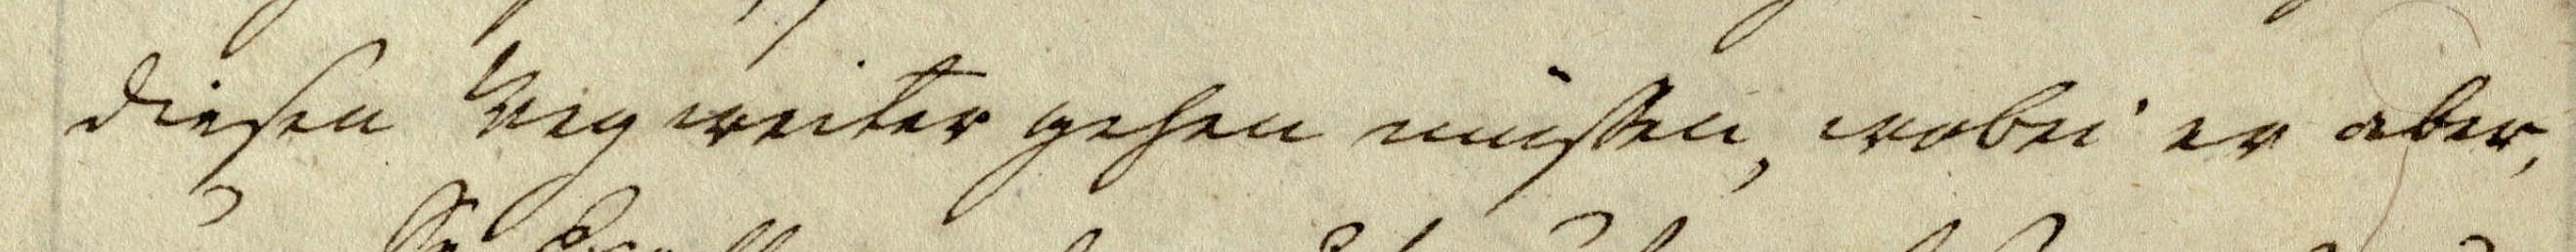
diesen Weg weiter gehen müssen, wobei er aber,
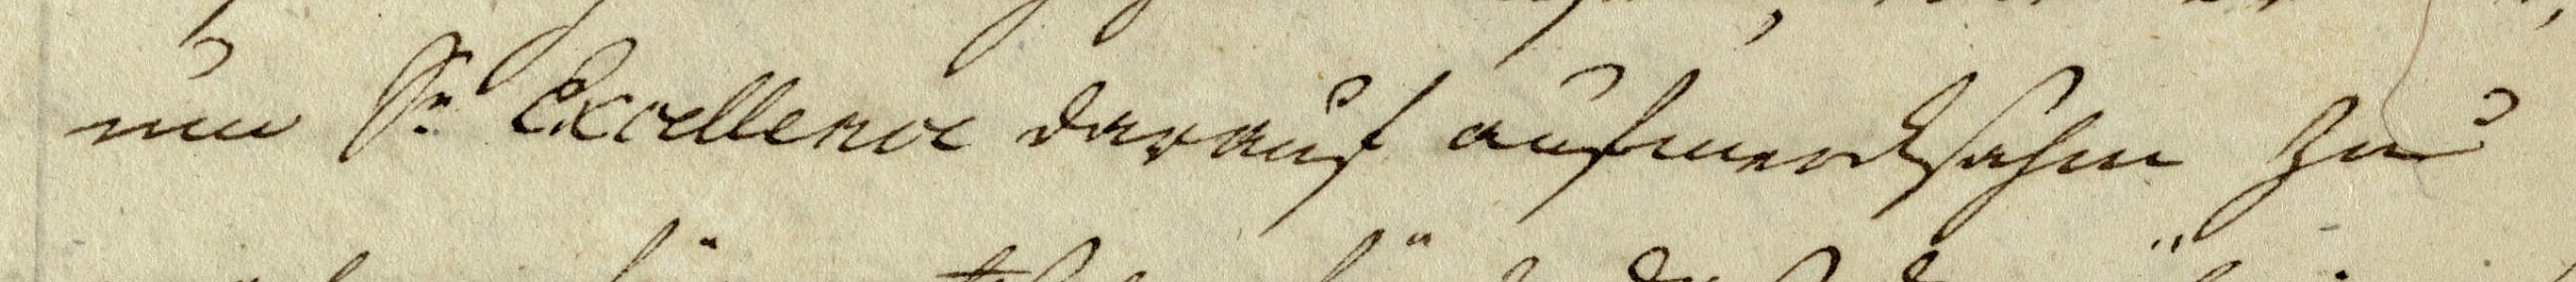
um Sr Excellence darauf aufmercksahm zu
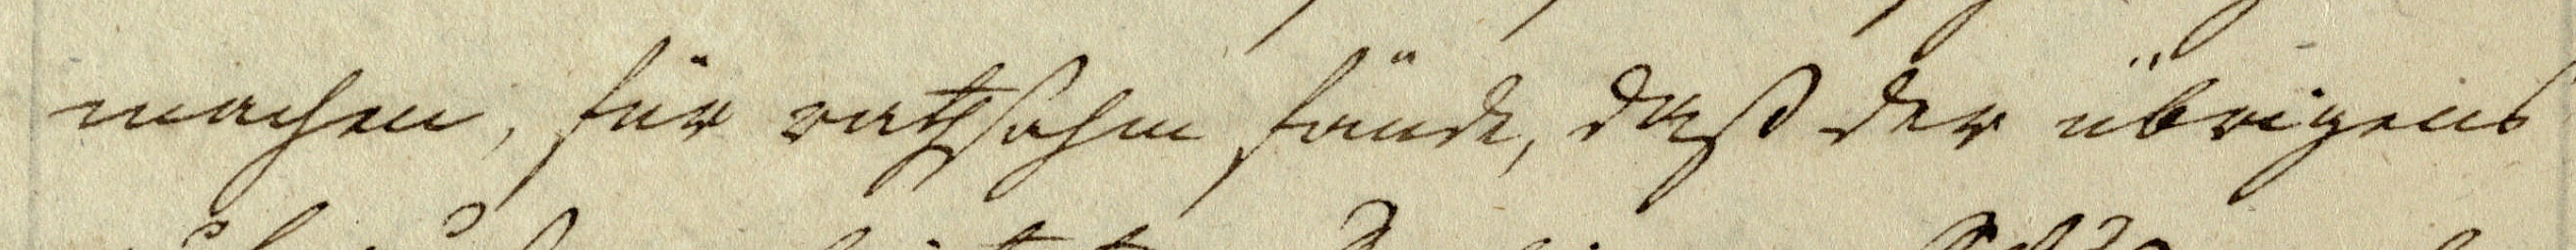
machen, für rathsahm fände, daß der übrigens
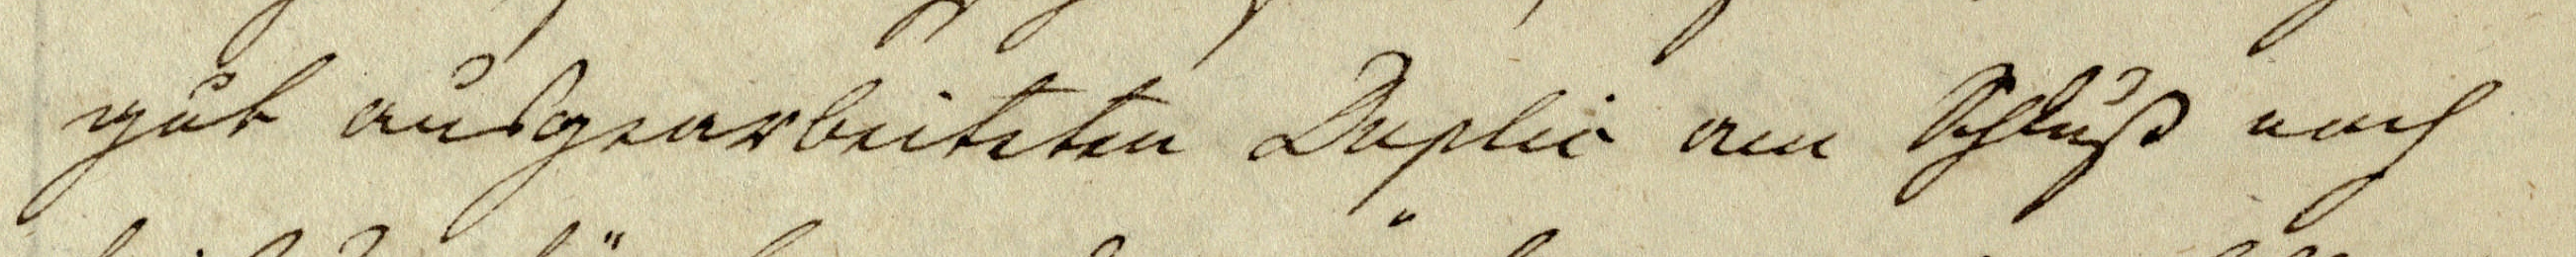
gut ausgearbeiteten Duplic am Schluß noch
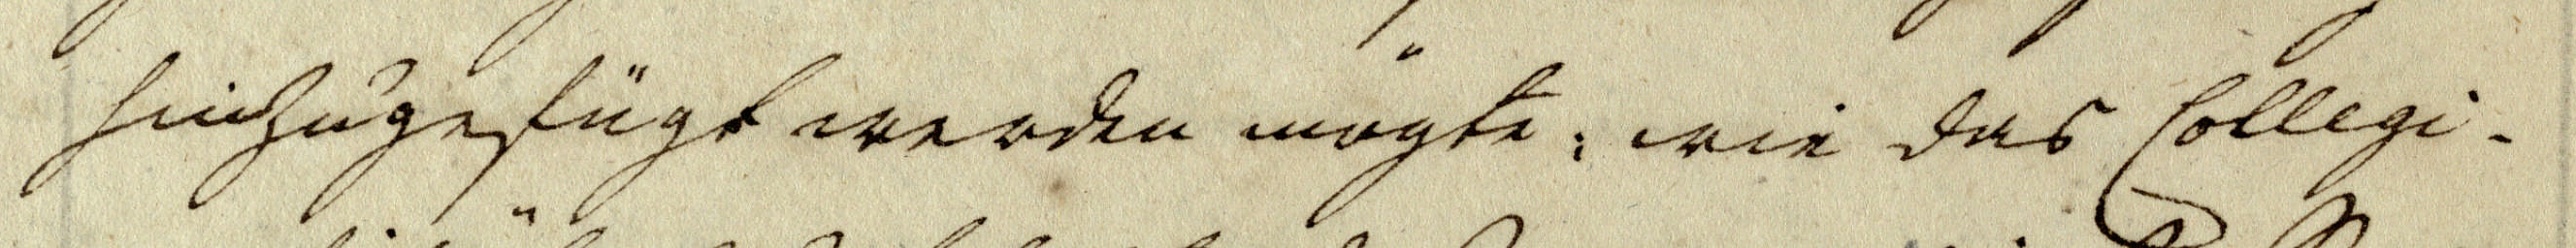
hinzugefügt werden mögte: wie das Collegi¬
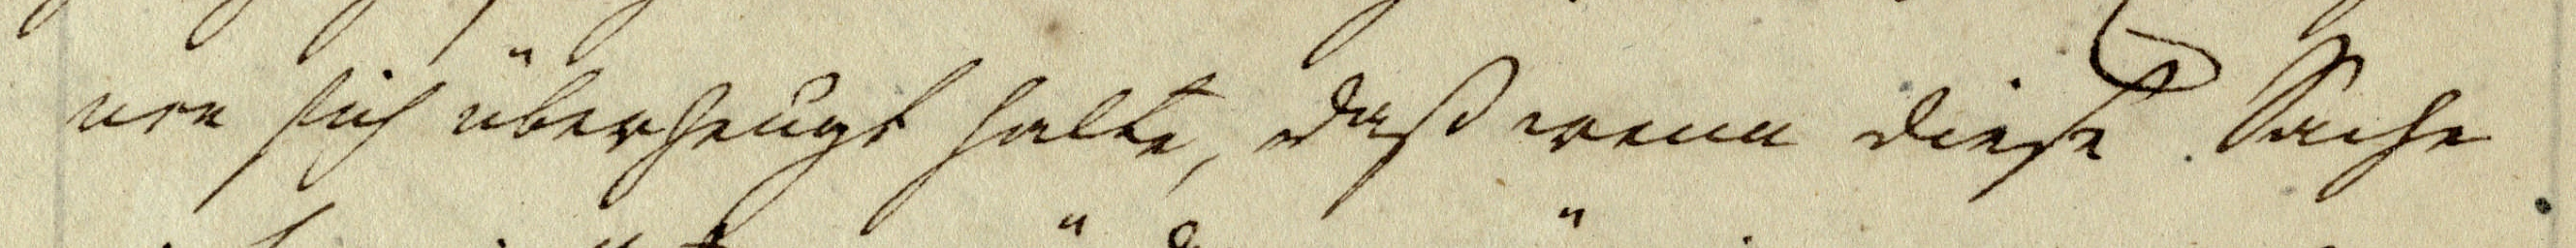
um sich überzeugt halte, daß wenn diese Sache
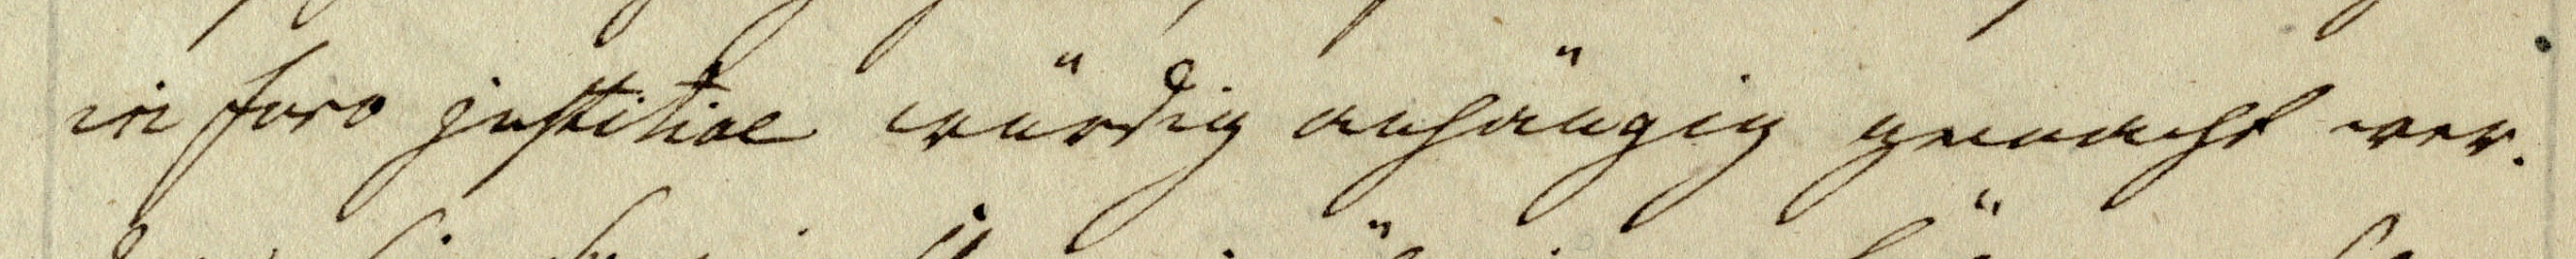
in foro justitiae würdig anhängig gemacht wer¬
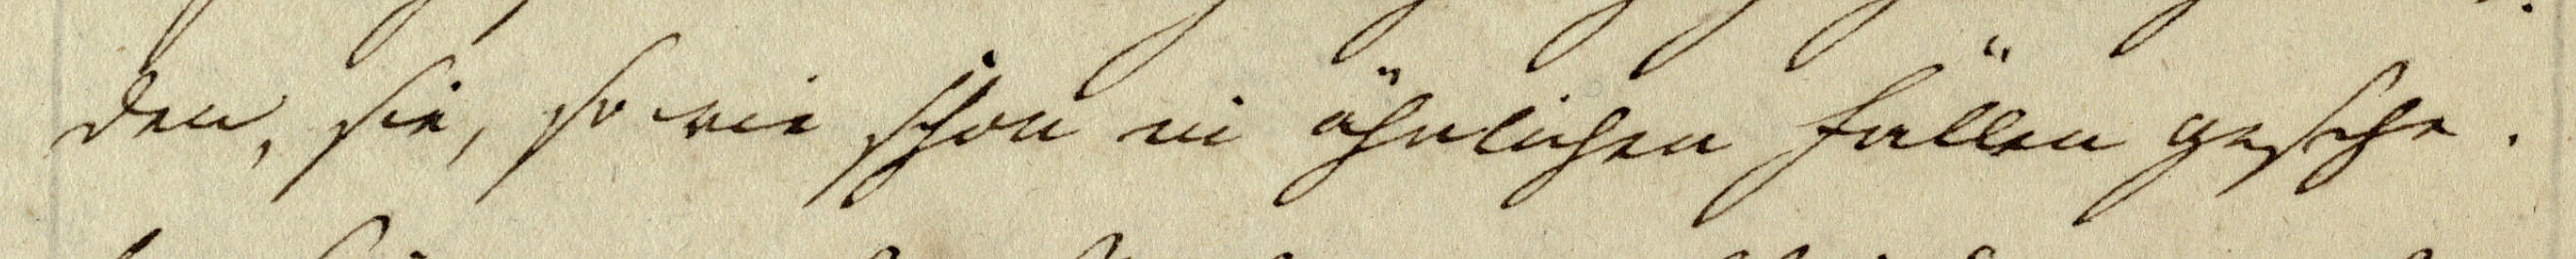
den, sie, so wie schon in ähnlichen Fällen gesche¬
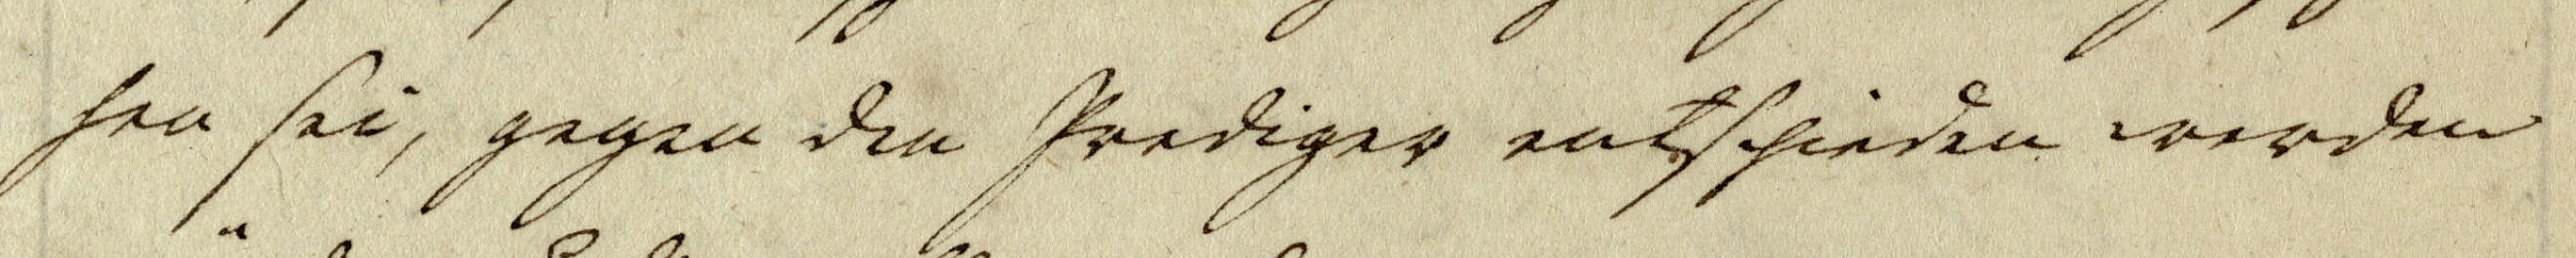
hen sei, gegen den Prediger entschieden werden
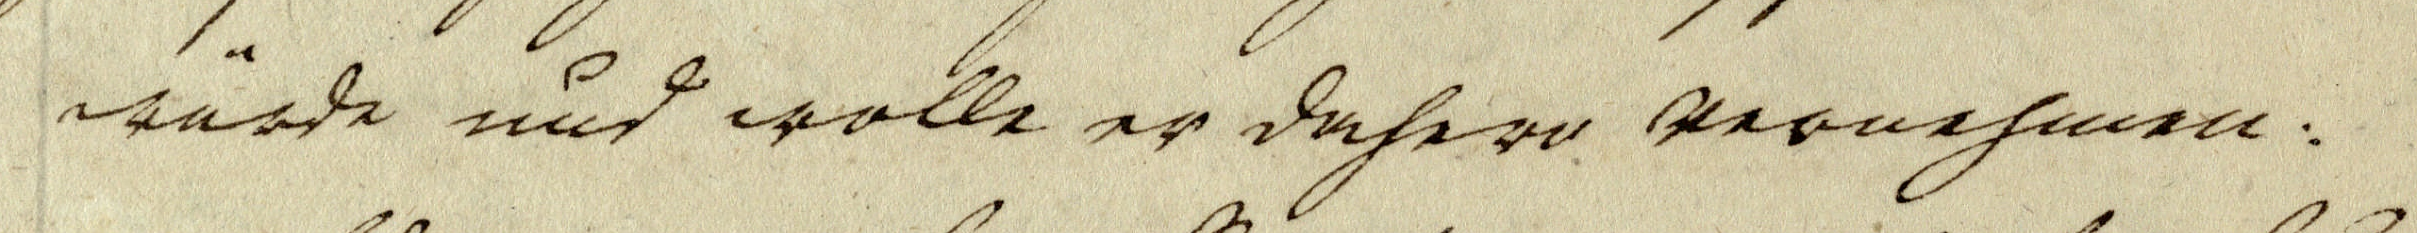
würde und wolle er daher vernehmen:
